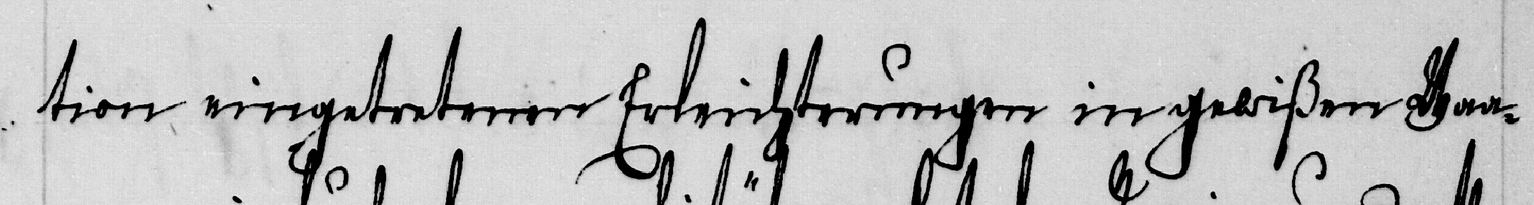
tion eingetretenen Erleichterungen in gewißen Waa¬
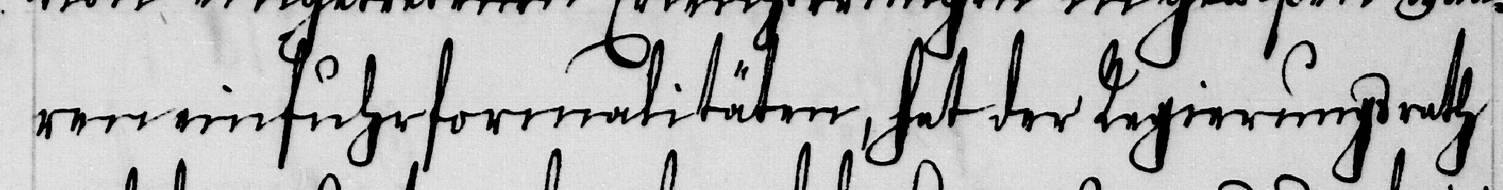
reneinfuhrformalitäten, hat der Regierungsrath
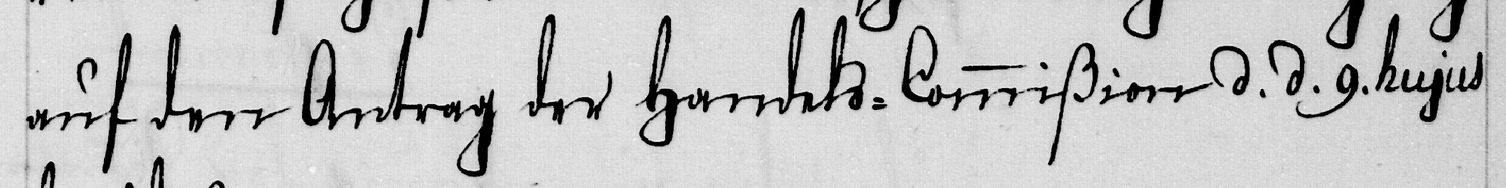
auf den Antrag der Handels-Commißion d. d. 9. hujus
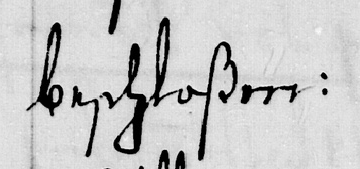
beschloßen:
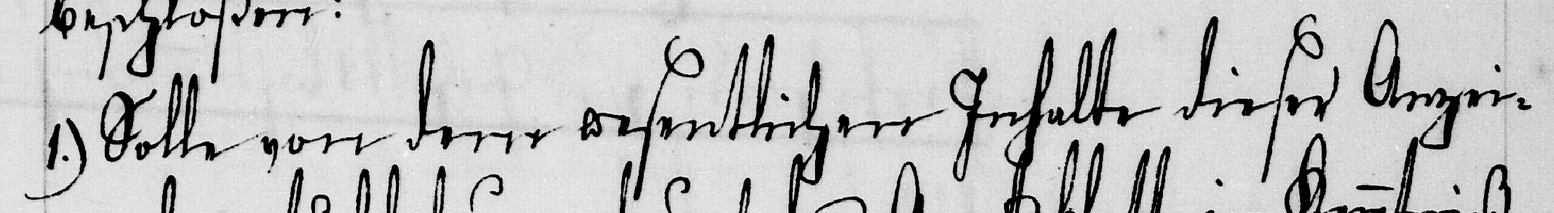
1.) Solle von dem wesentlichen Inhalte dieser Anzei¬
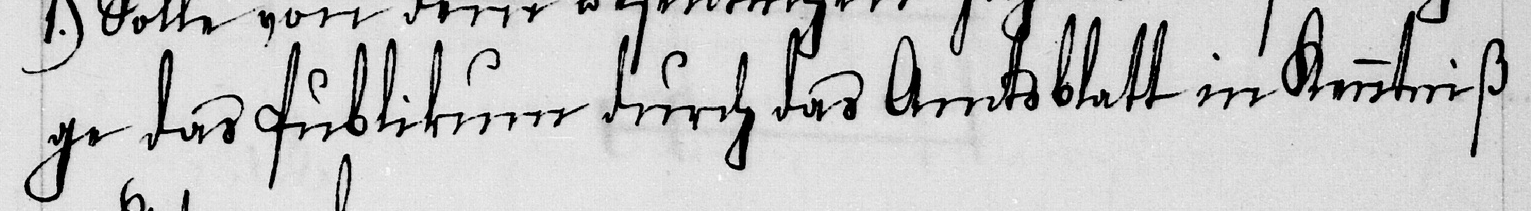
ge das Publikum durch das Amtsblatt in Kenntniß
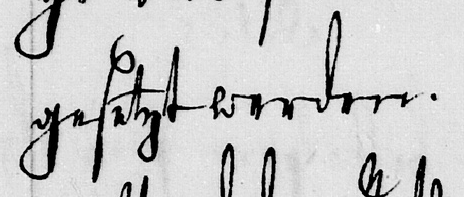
gesetzt werden.
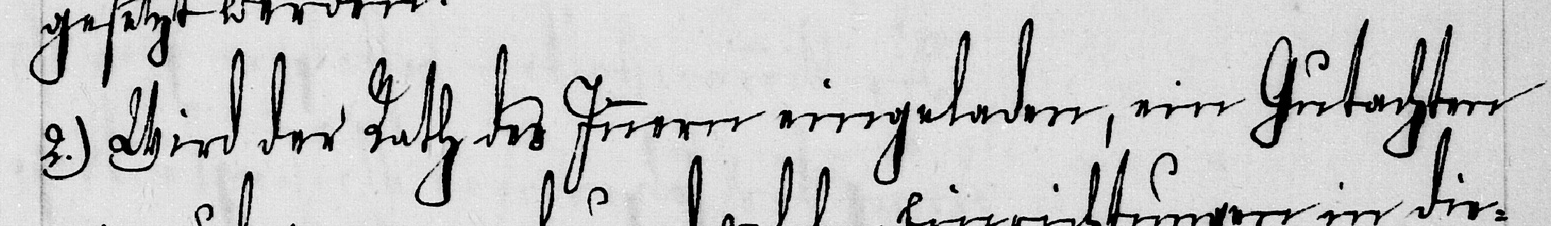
2.) Wird der Rath des Innern eingeladen, ein Gutachten
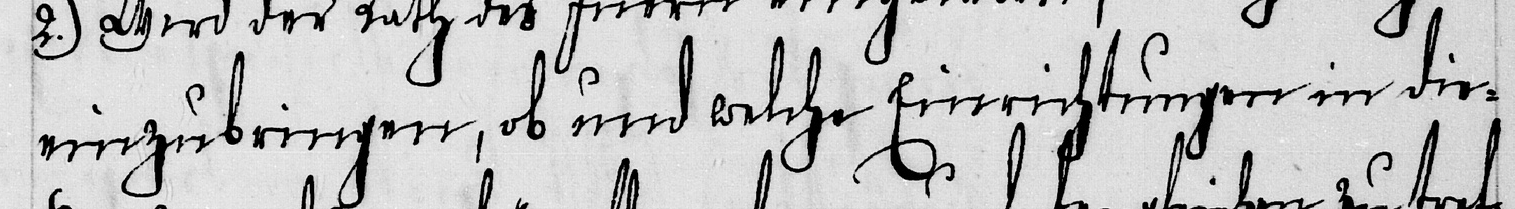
einzubringen, ob und welche Einrichtungen in die¬
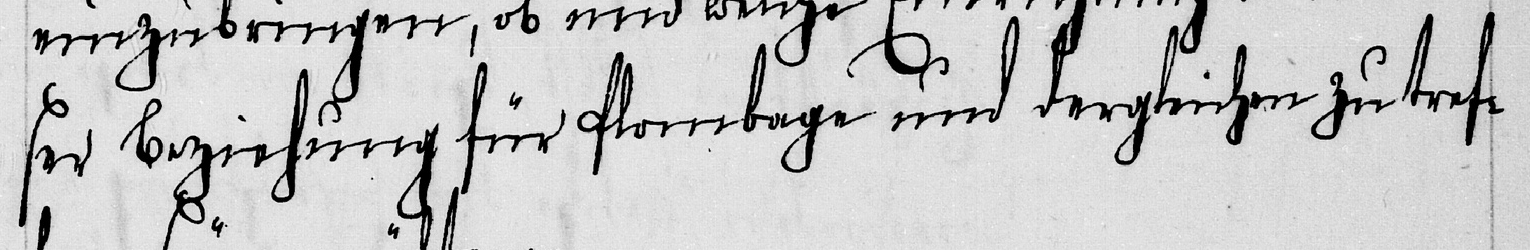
ser Beziehung für Plombage und dergleichen zu tref¬
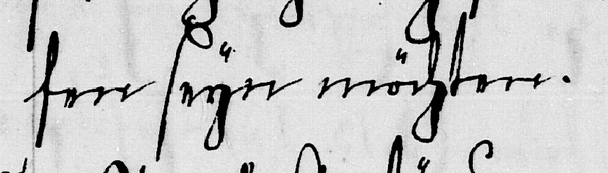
fen seyn möchten.
